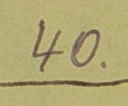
40
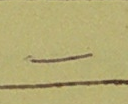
-
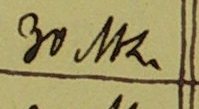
30. Mr.
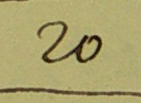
20
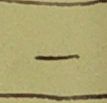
-
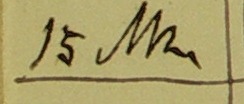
15. Mr.
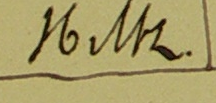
16. Mr.
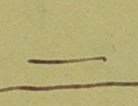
-
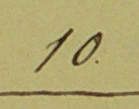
10
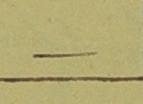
-
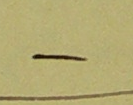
-
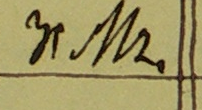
31. Mr.
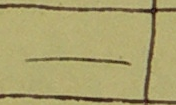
-
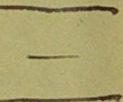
-
